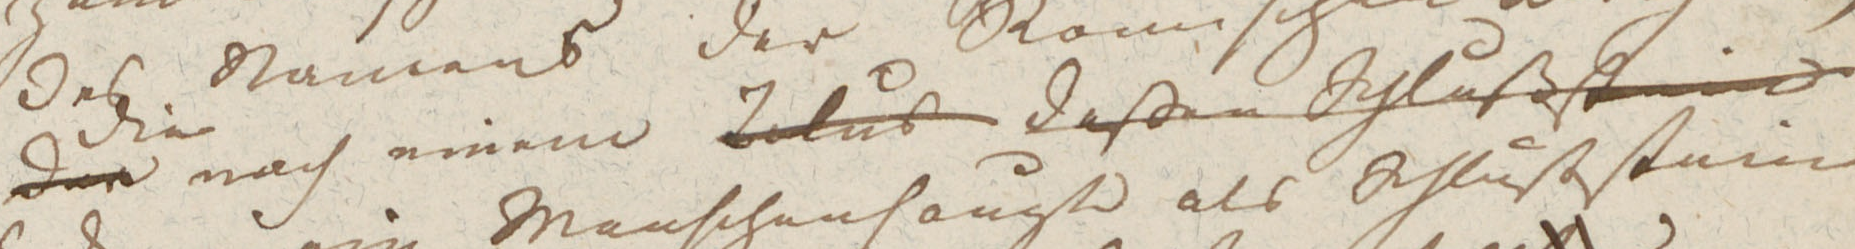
die nach einem Telus dessen Schlussstein
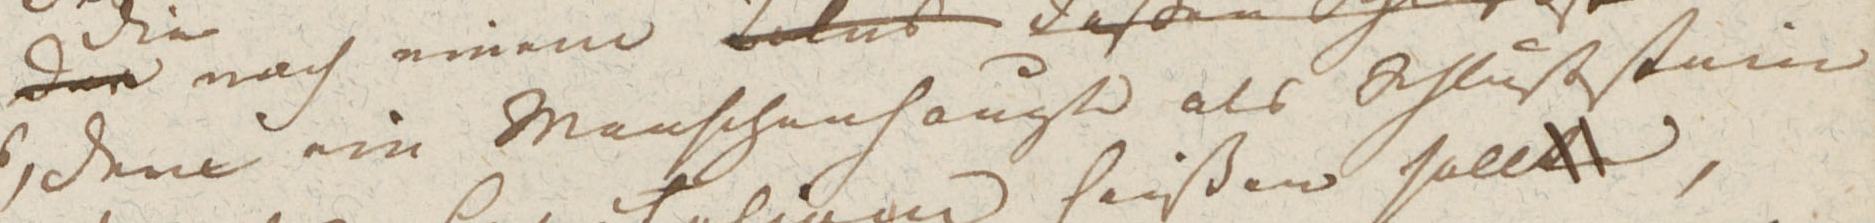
denm ein Menschenhaupt als Schlussstein
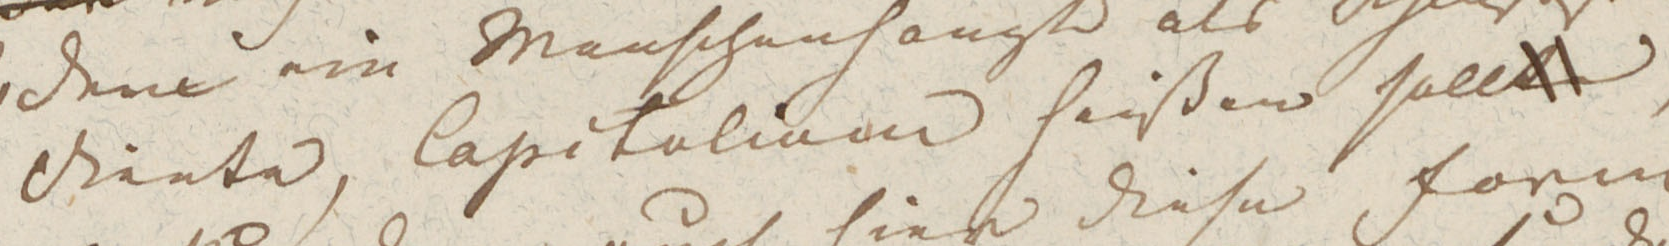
diente, Capitoliumheissen sollte,
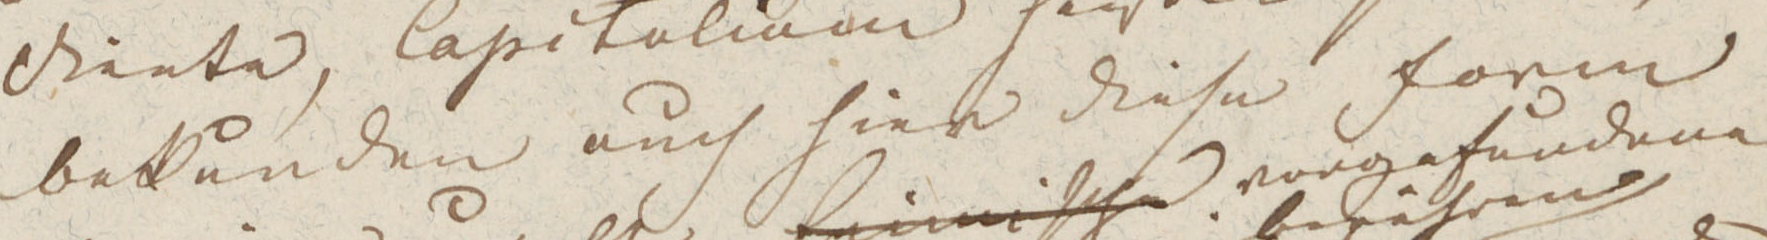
bekunden auch hier diese Form
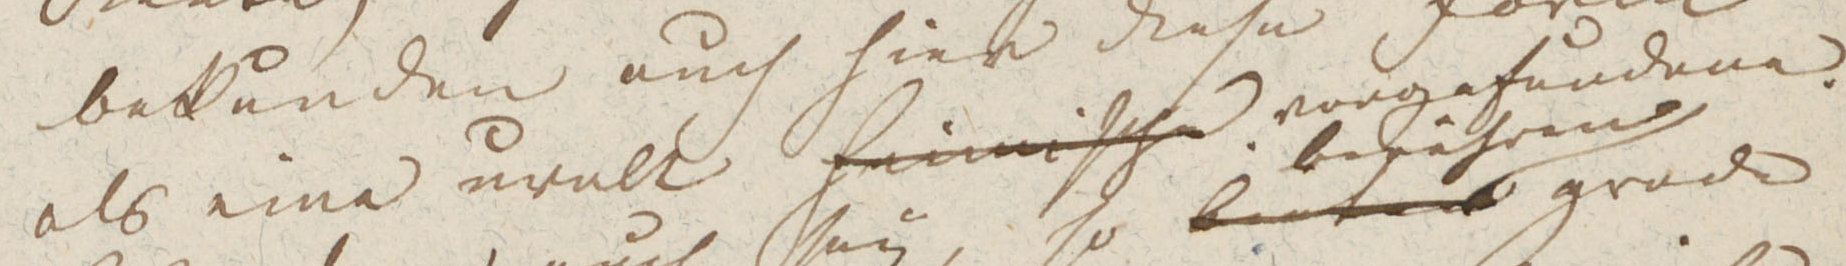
als eine uralt heimische vorgefundene.
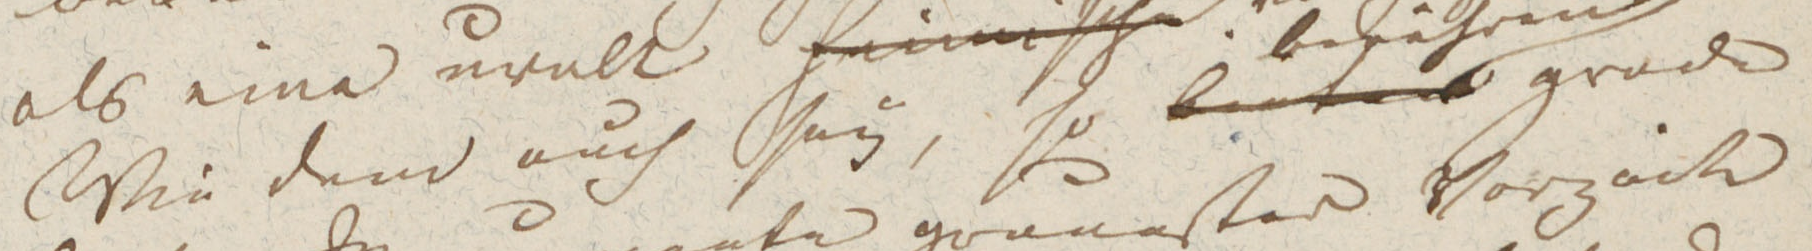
Wie dem auch sey, so bieten berühren grade
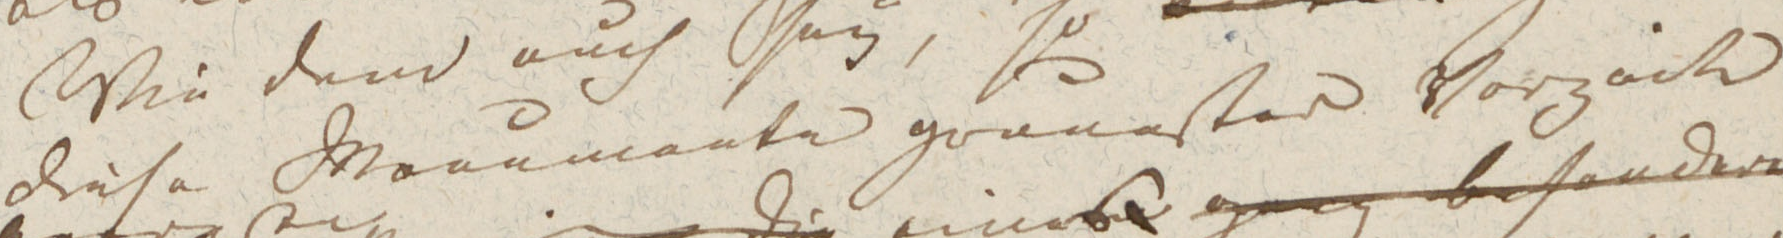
diese Monumente grauester Vorzeit
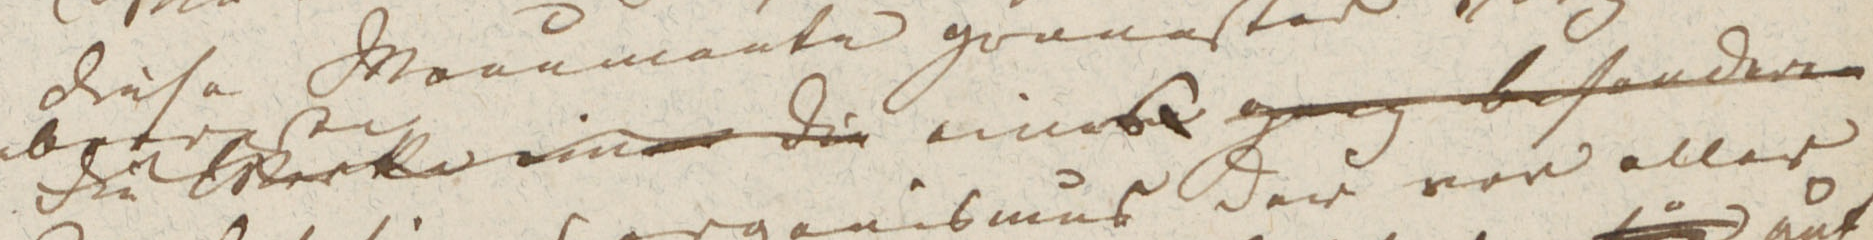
die Werke einer die einers ganz besonderen
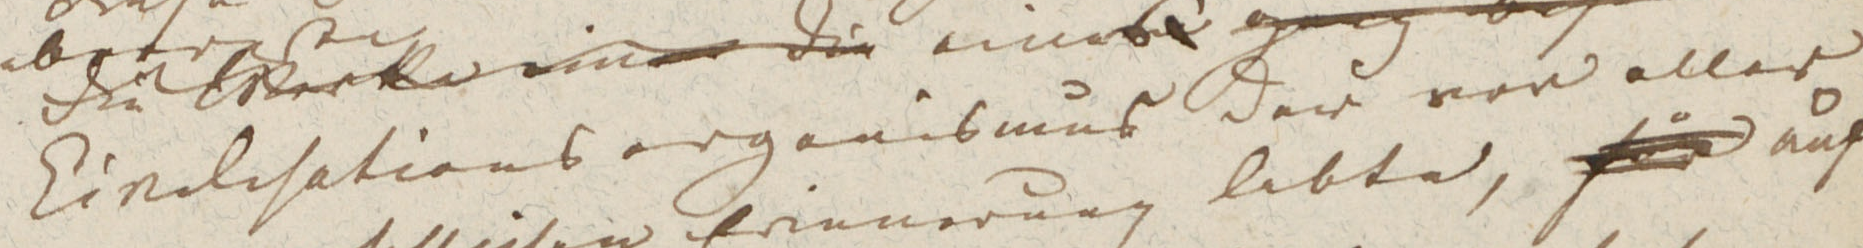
Civilisationsorganismus der vor aller
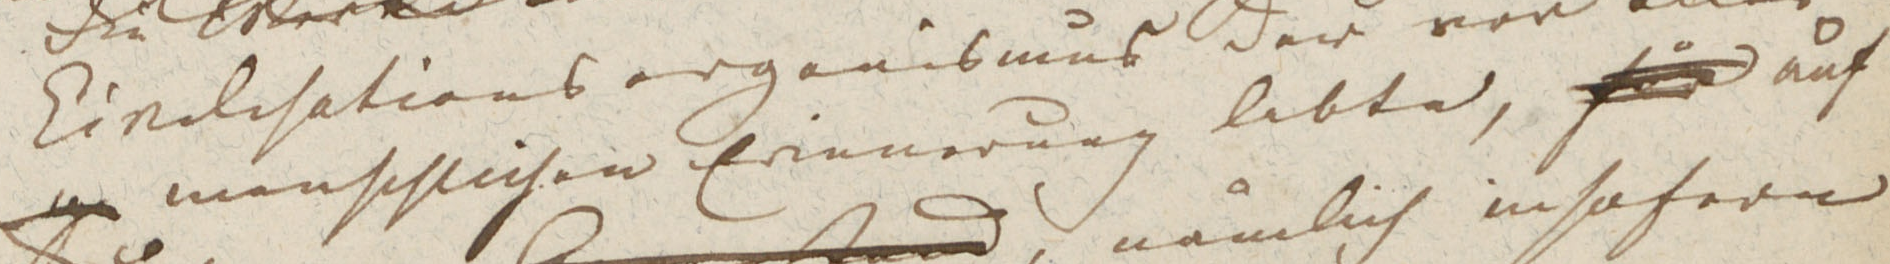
ge menschlichen Erinnerung lebte, für auf
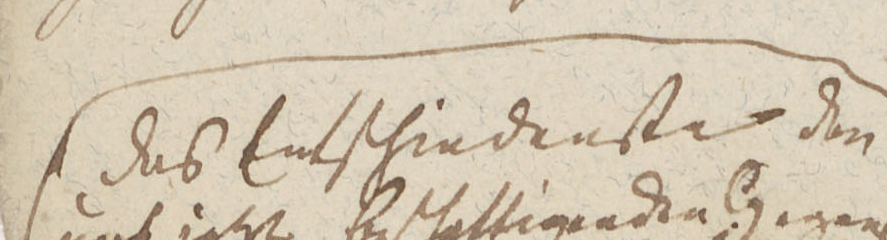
das Entschiedenste den
